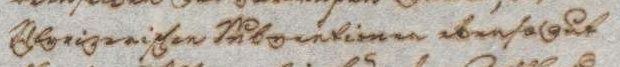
Schweizerischen Subventionen ebensogut
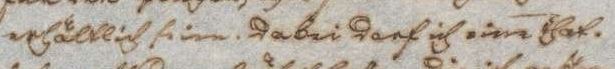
erhältlich seien. Dabei darf ich eine That-
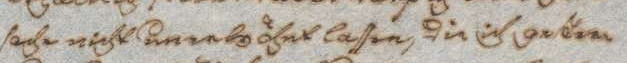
sache nicht unerwähnt lassen, die ich gestern
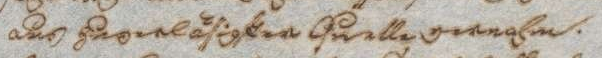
aus zuverlässigster Quelle vernahm.
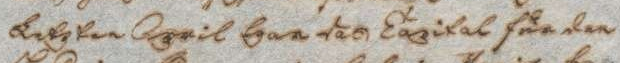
Letzten April war das Capital für den
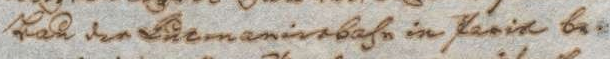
Bau der Lucmanierbahn in Paris be-
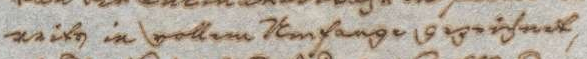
reits in vollem Umfange gezeichnet,
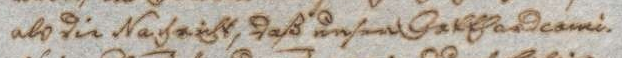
als die Nachricht, daß unser Gotthardcomi-
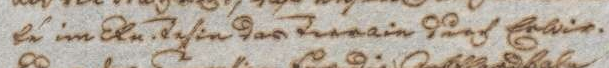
té im Ctn. Tessin das Terrain durch Erwir-
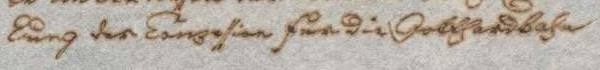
kung der Conzession für die Gotthardbahn
